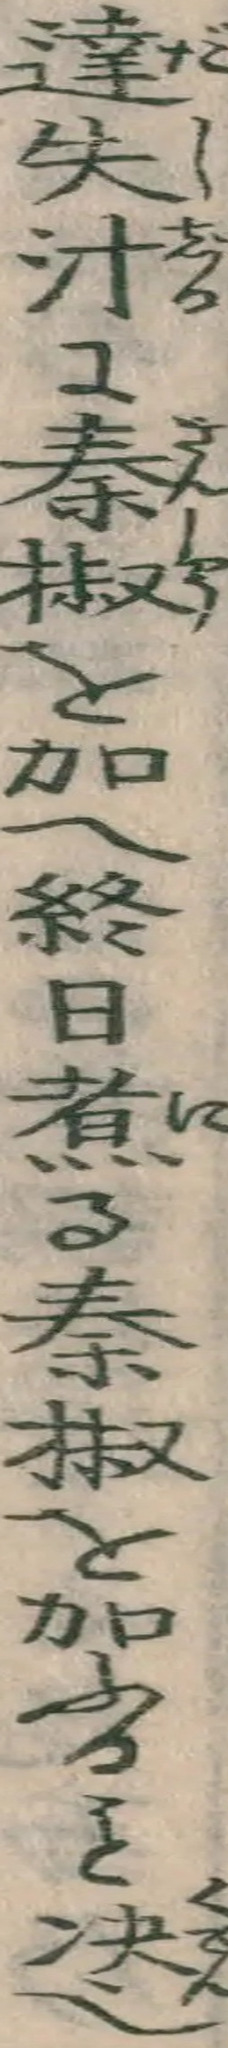達失汁に秦椒を加へ終日煮る秦椒を加ふること決也
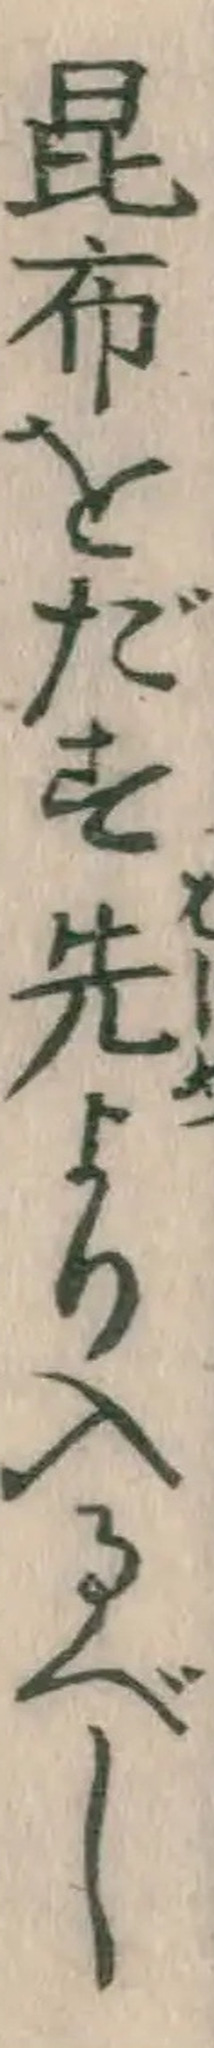昆布をだす先より入るべし
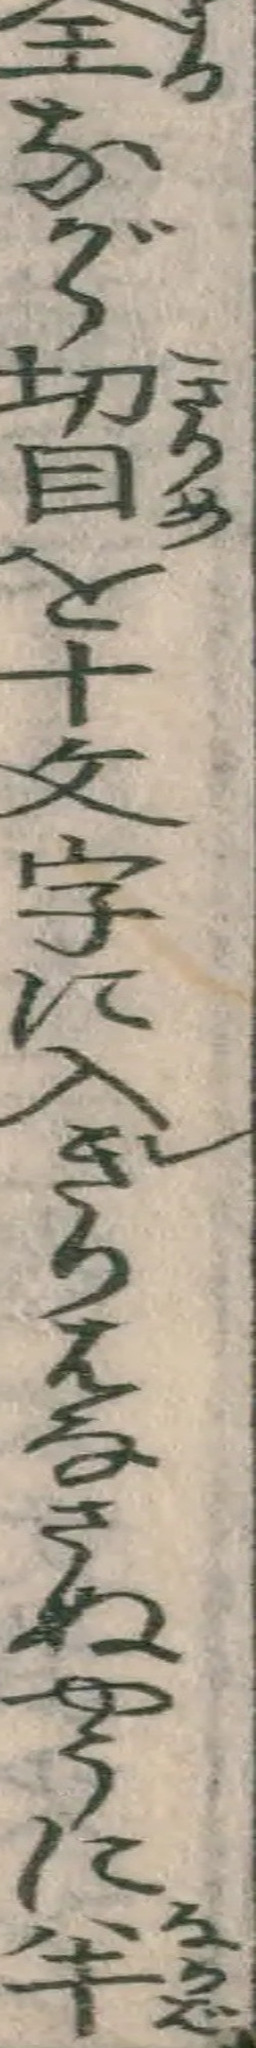全ながら切目を十文字に入れきりはなさぬやうに半
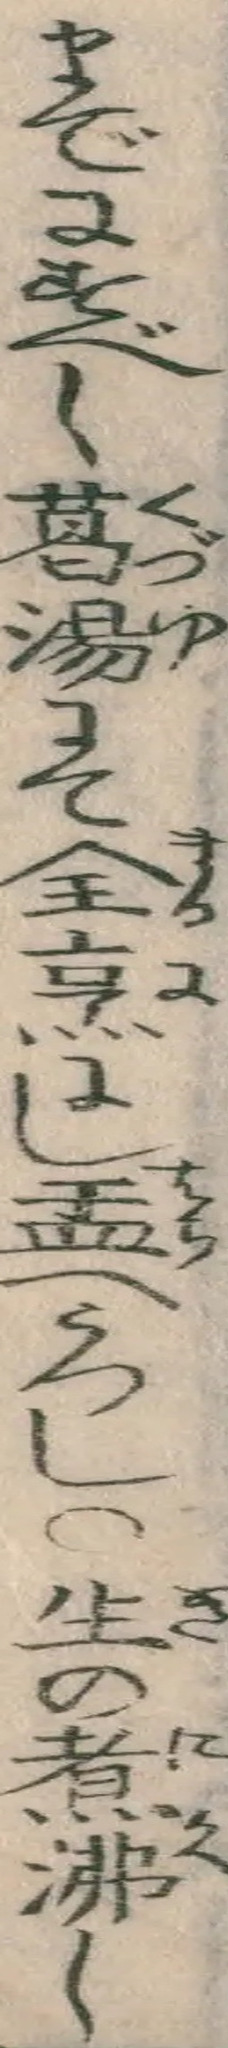までにすべし葛湯にて全烹にし盂へうつし○生の煮沸し
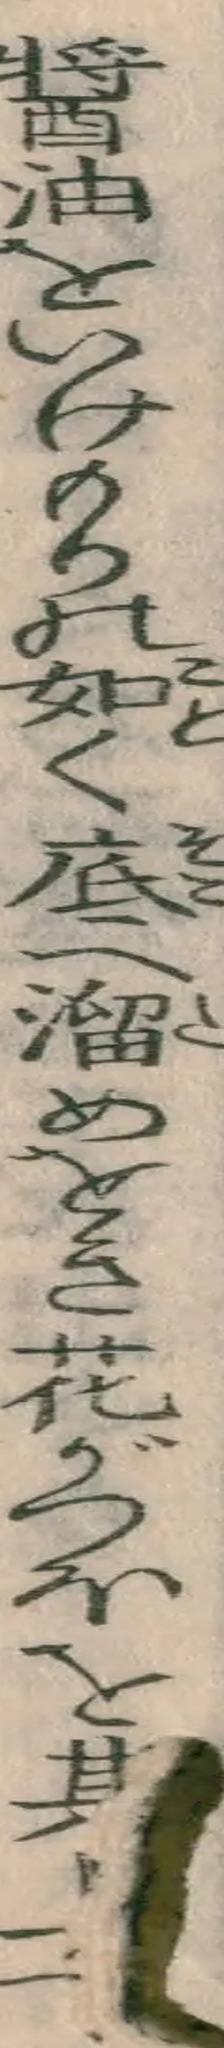醤油をいけもりの如く底へ溜めをき花がつほを其
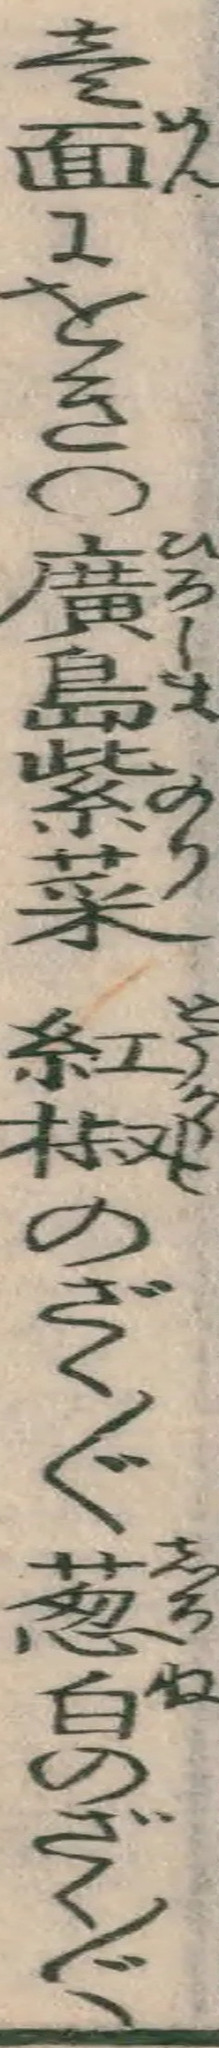壱面にをき○広島紫菜紅椒のざく〴〵葱白のざく〴〵
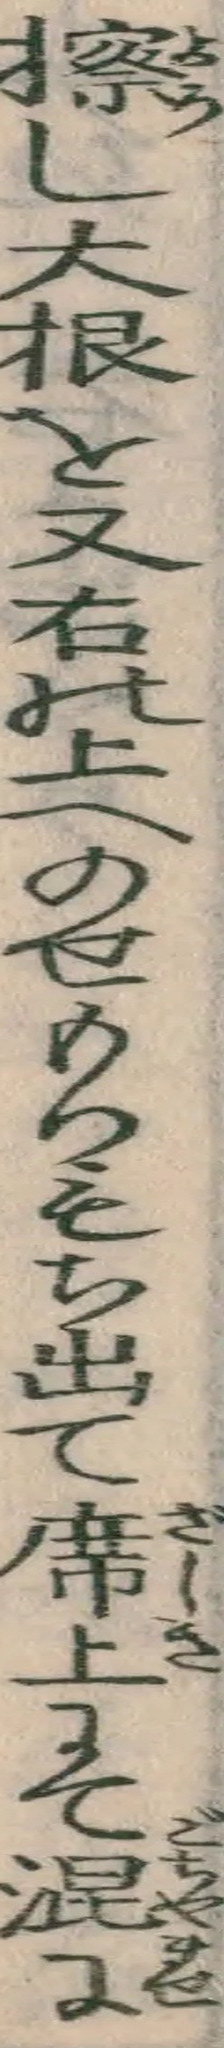擦し大根を又右の上へのせもりもち出て席上にて混に
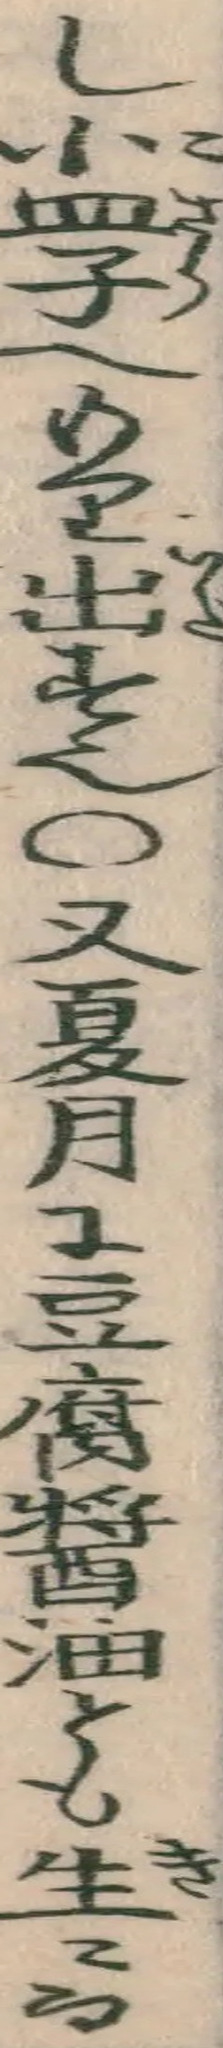し小皿子へもり出す也○又夏月に豆腐醤油とも生にて
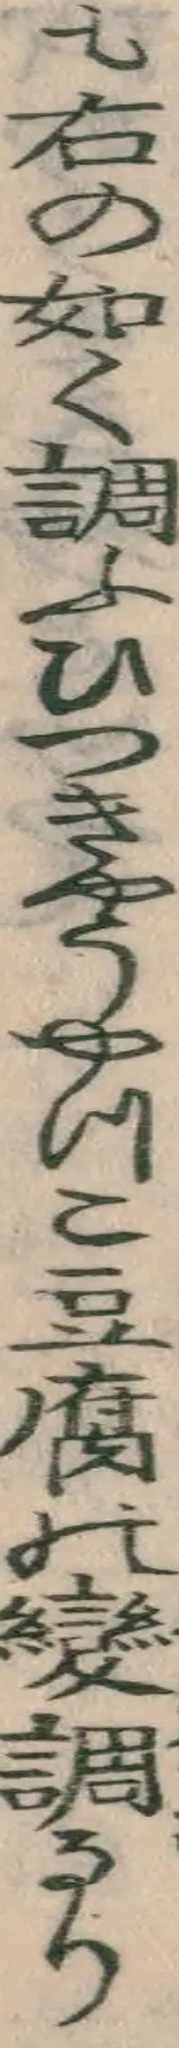も右の如く調ふひつきやうやつこ豆腐の変調なり
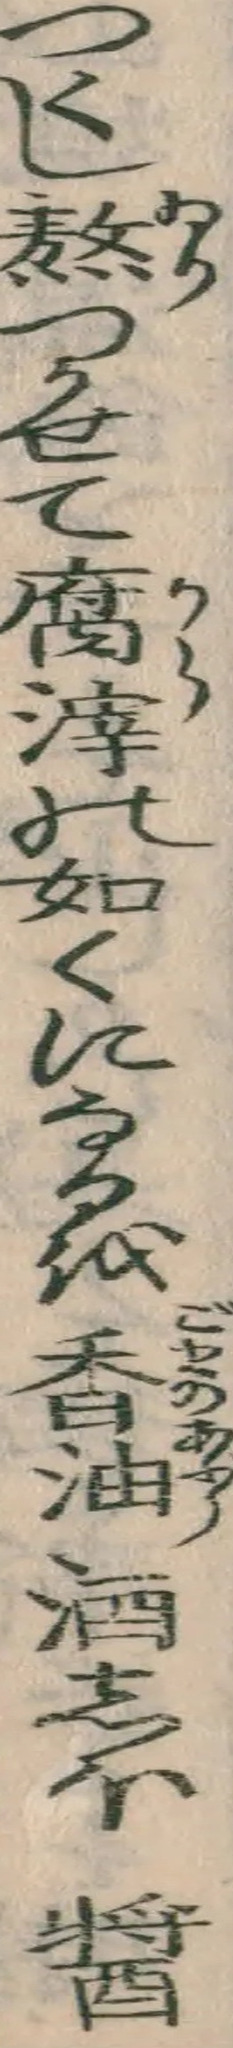つくし熬つかせて腐滓の如くになるを香油酒しほ醤
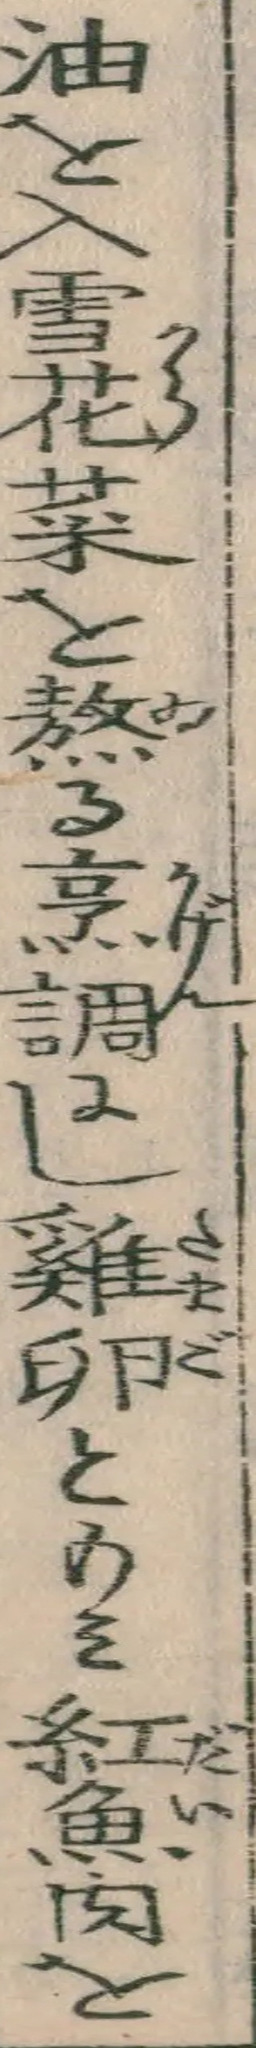油を入雪花菜を熬る烹調よし雞卵ともみ紅魚肉を
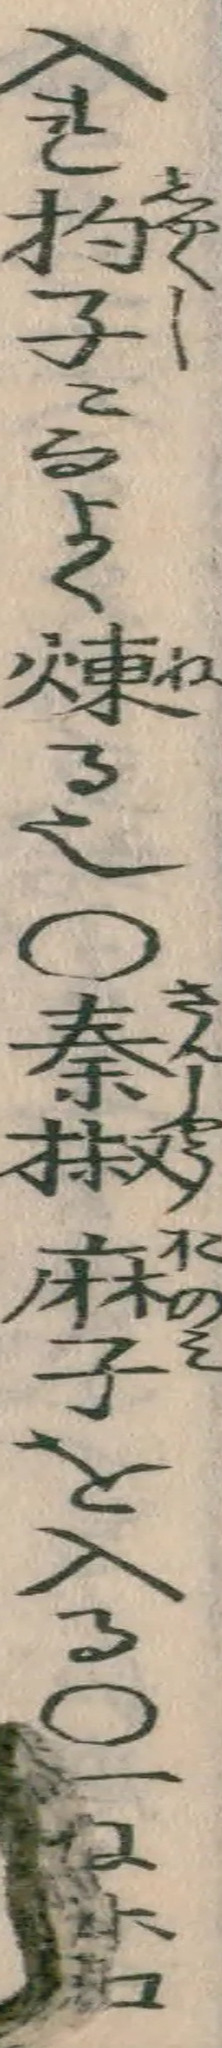入れ杓子にてよく煉る也○秦椒麻子を入る○一にホロ
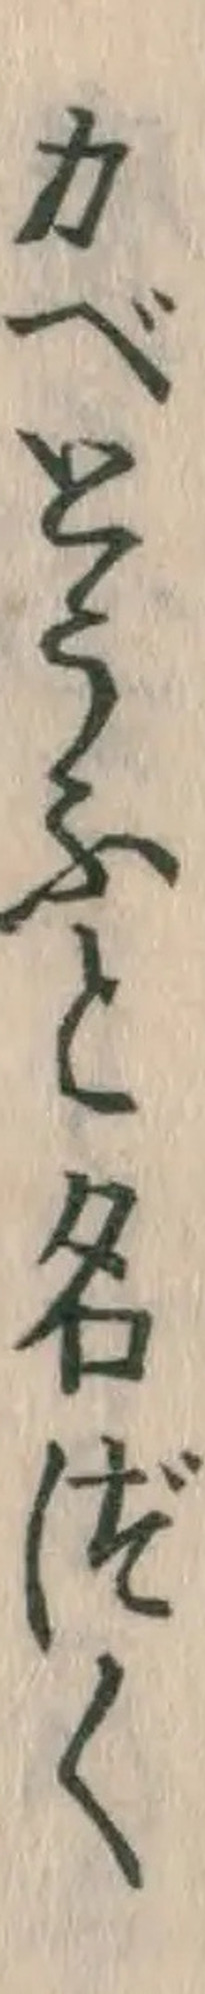カベとうふと名づく
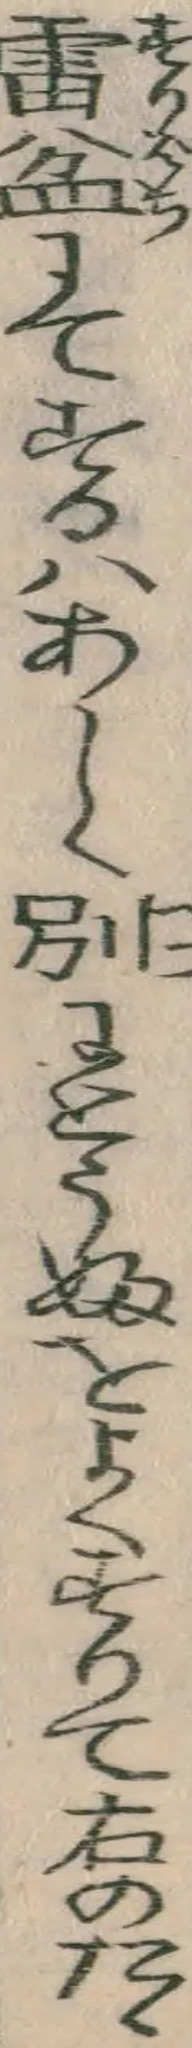雷盆にてするはあしく別にとうふをよくすりて右のたゝ
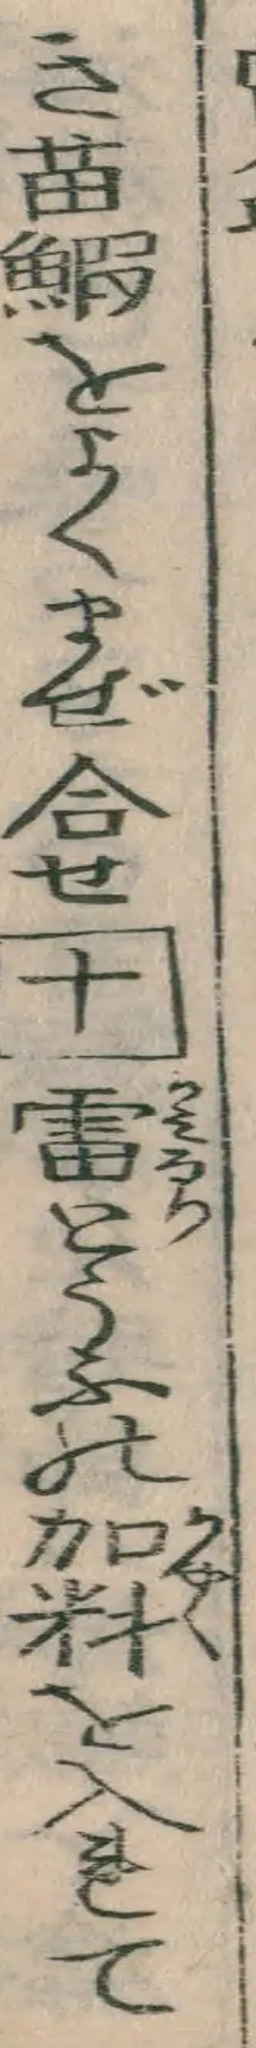き苗鰕をよくまぜ合せ[十]雷とうふの加料を入れて

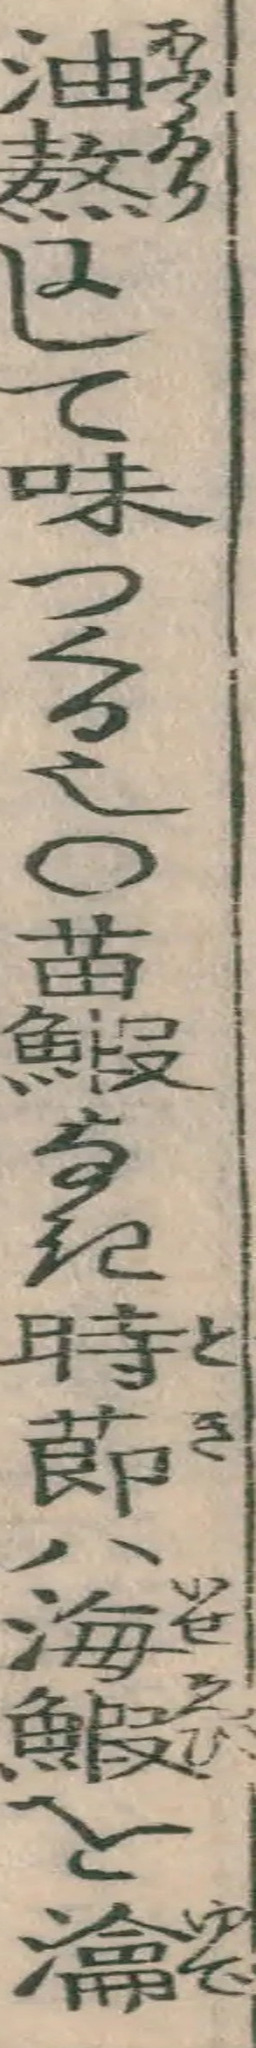油熬にして味つくる也◯苗鰕なき時莭ハ海鰕を㵸
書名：豆腐百珍. [正編]
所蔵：国立国会図書館 National Diet Library, JAPAN
